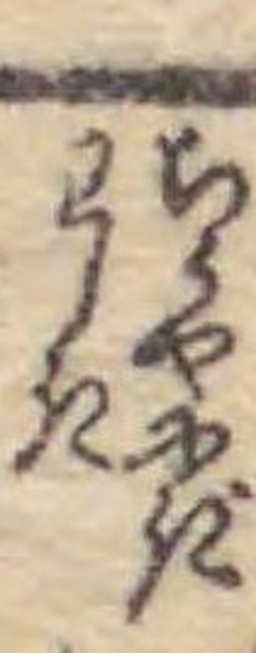わしき
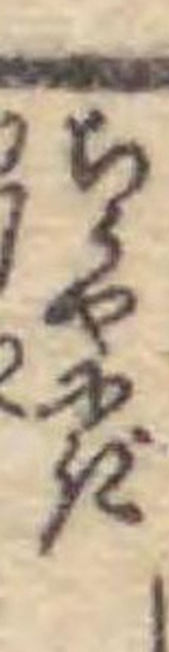ちうやにぎ
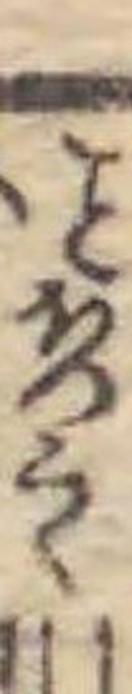ことほつこく
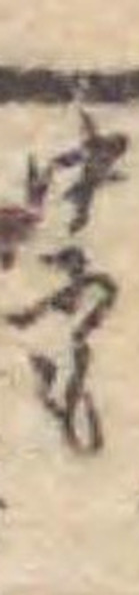中にも
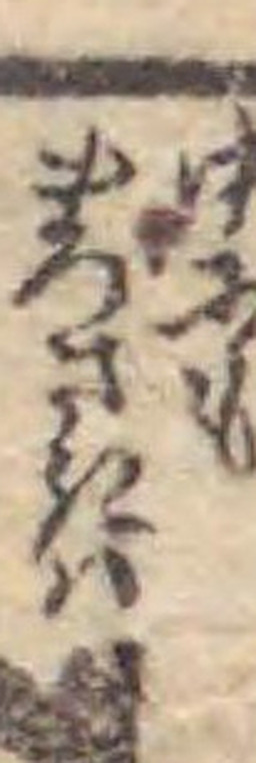まつさきは
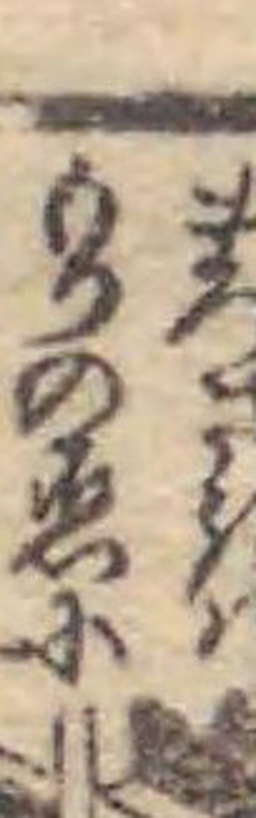もりの丞に
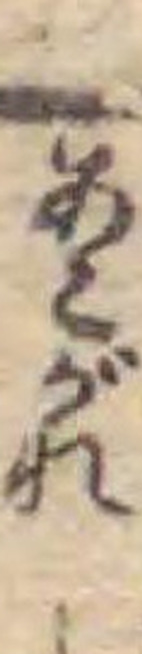あこがれ
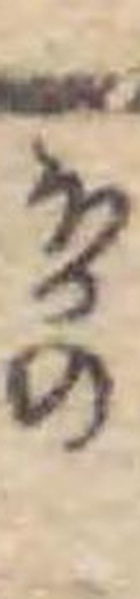ほかの
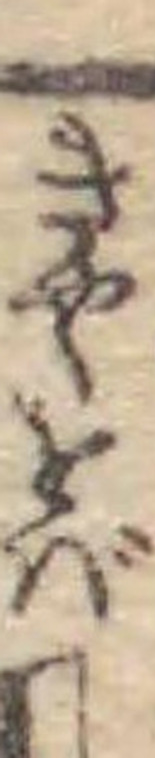きやくをば
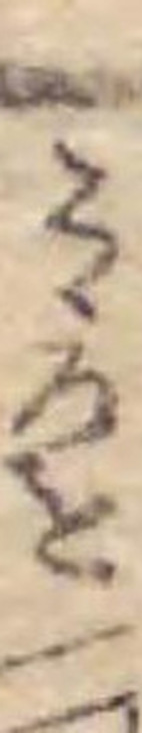こゝろを
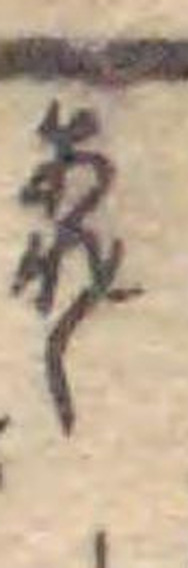あれ〳〵
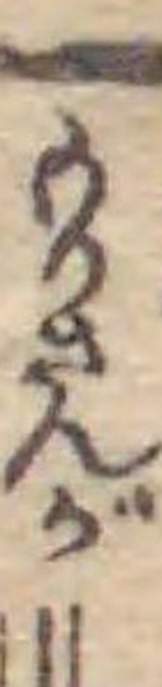もりさんが
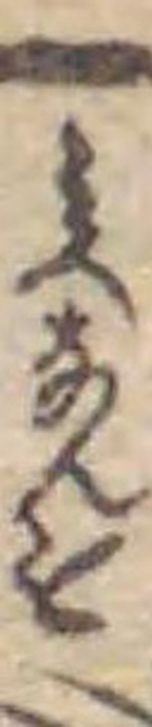みへなんす
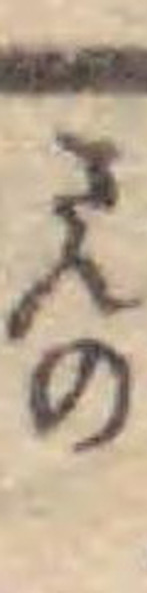さんの
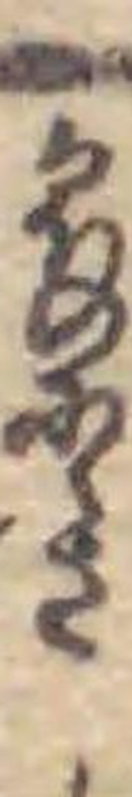かほのにくさ
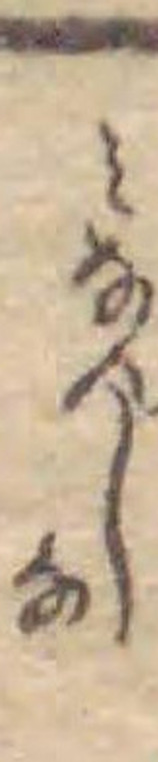みなんしな
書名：扨化狐通人 : 2巻
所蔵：国立国会図書館 National Diet Library, JAPAN
